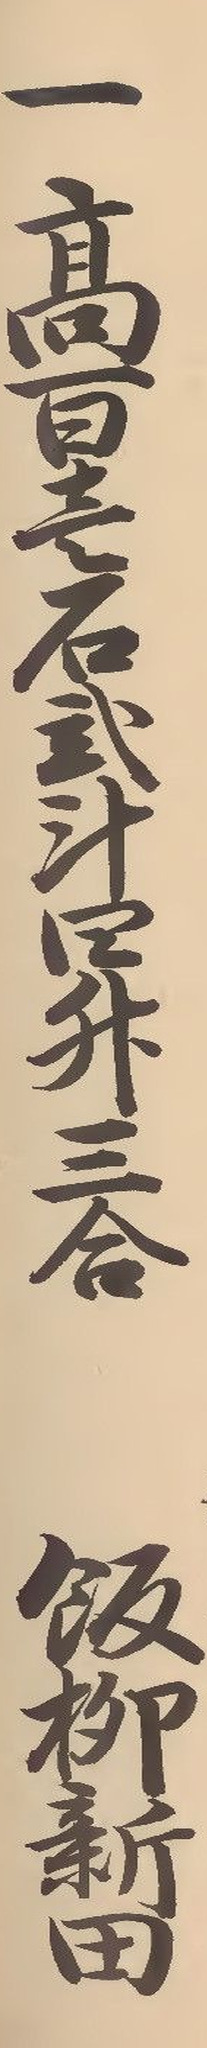一高百壱石弐斗四升三合飯柳新田
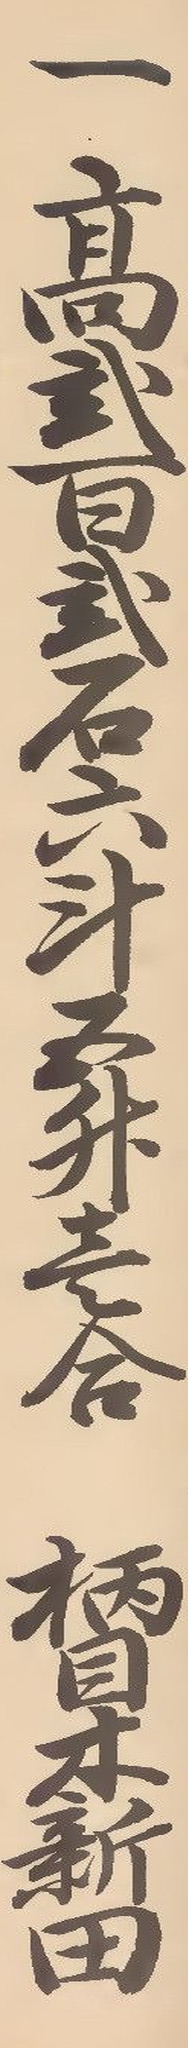一高弐百弐石六斗五升壱合柄目木新田
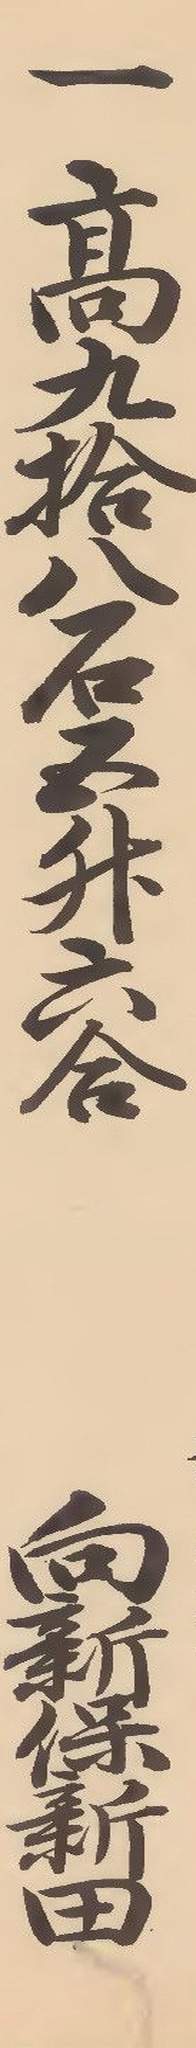一高九拾八石五升六合向新保新田
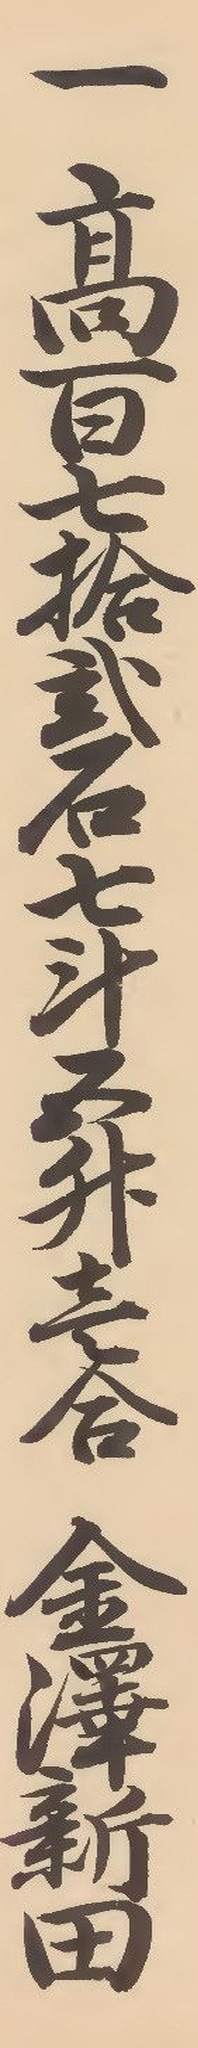一高百七拾弐石七斗五升壱合金沢新田
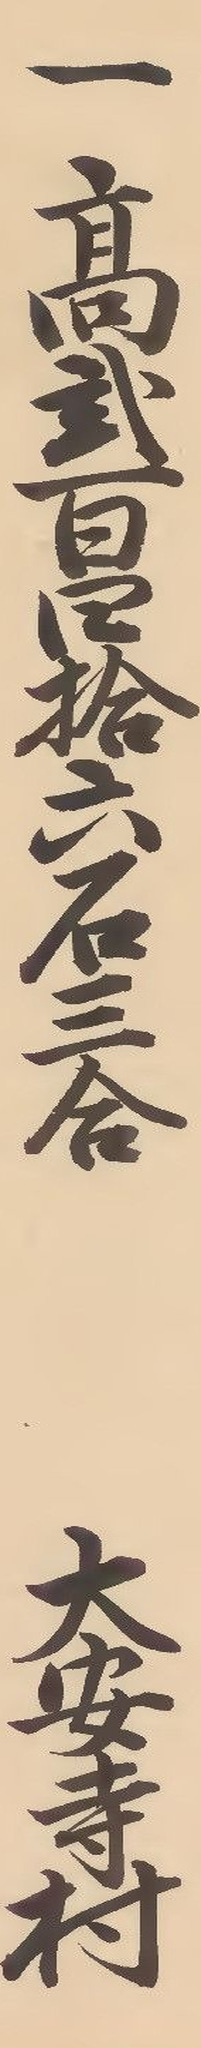一高弐百四拾六石三合大安寺村

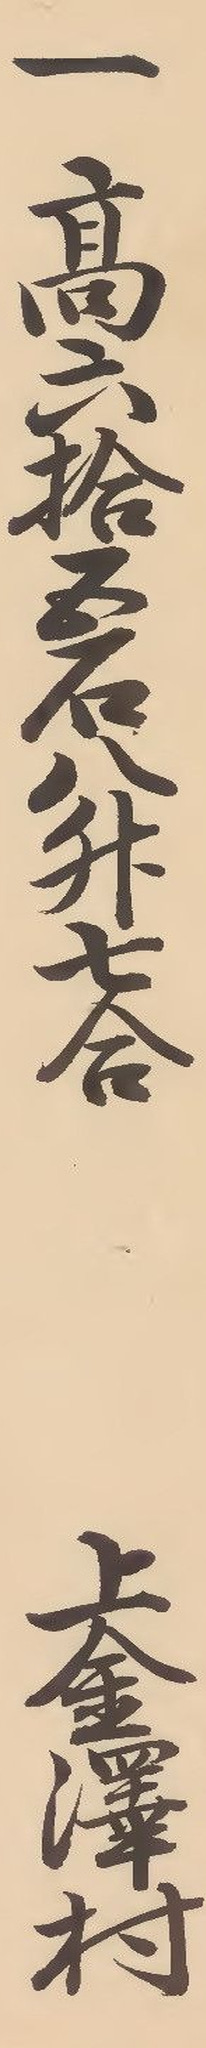一高六拾五石八升七合上金沢村
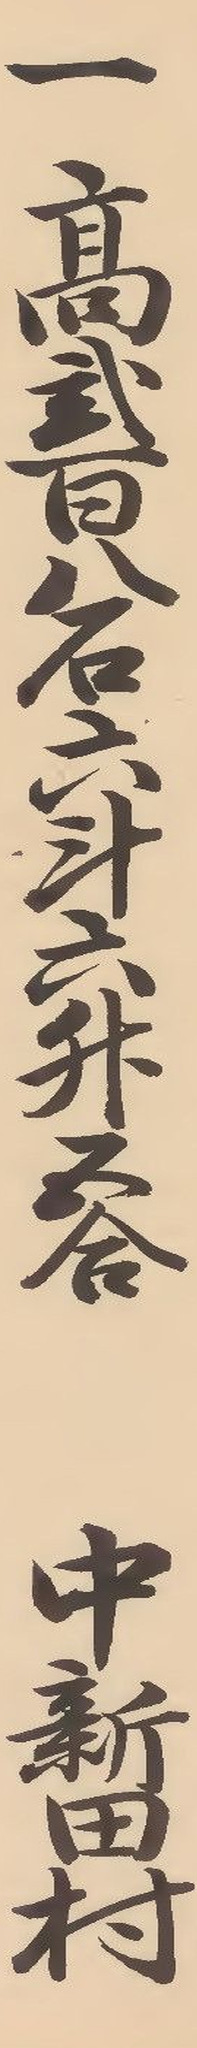一高弐百八石六斗六升五合中新田村
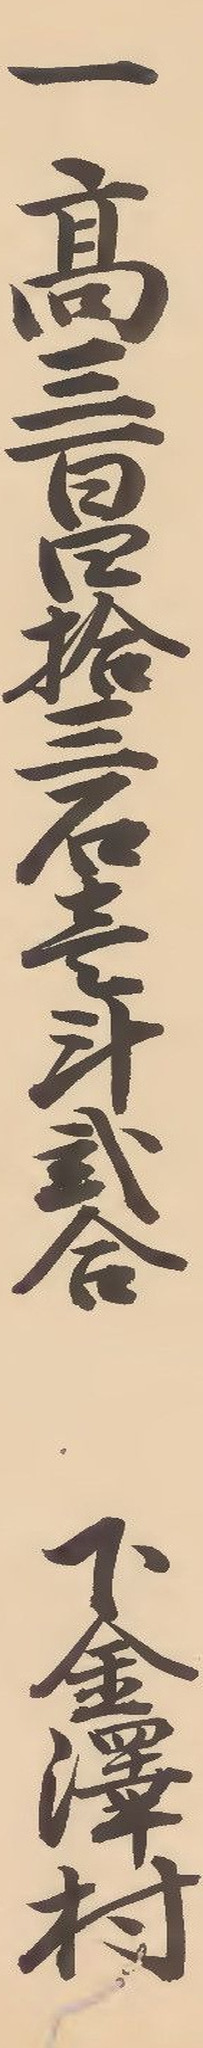一高三百四拾三石壱斗弐合下金沢村
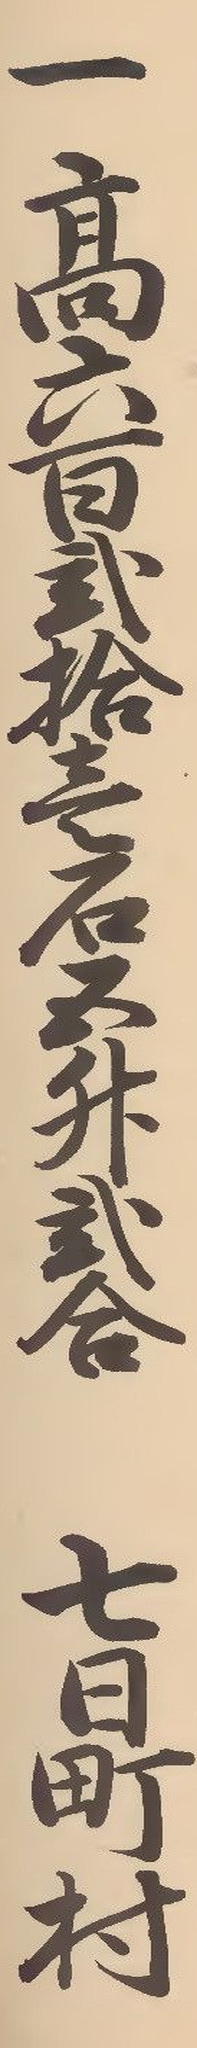一高六百弐拾壱石五升弐合七日町村
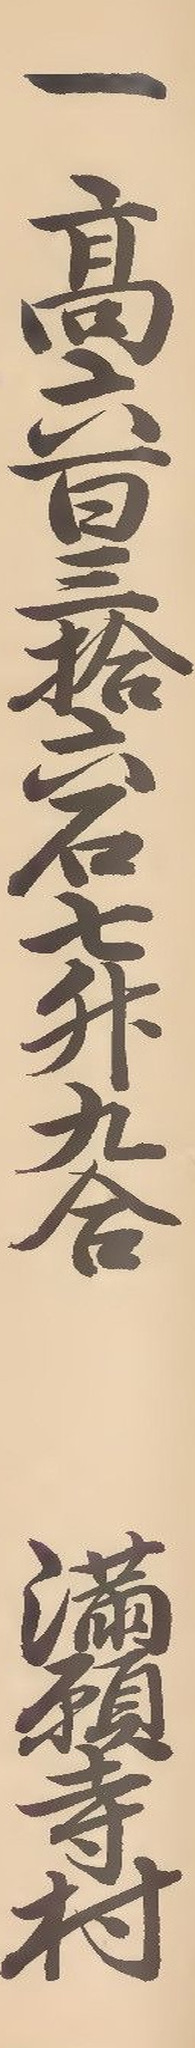一高六百三拾六石七升九合満願寺村
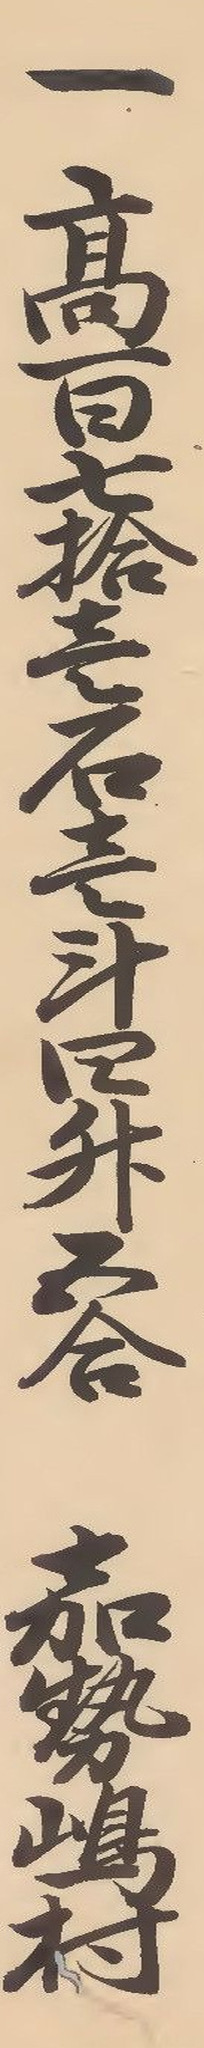一高百七拾壱石壱斗四升五合嘉勢島村
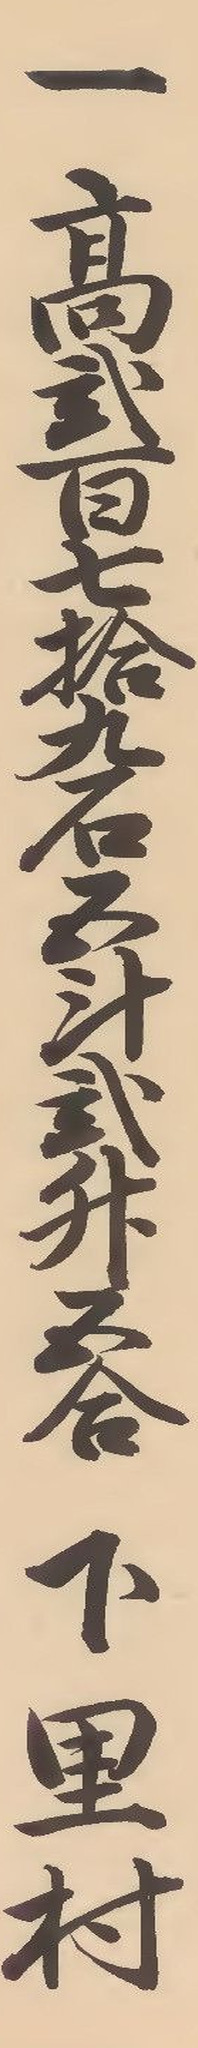一高弐百七拾九石五斗弐升五合下里村
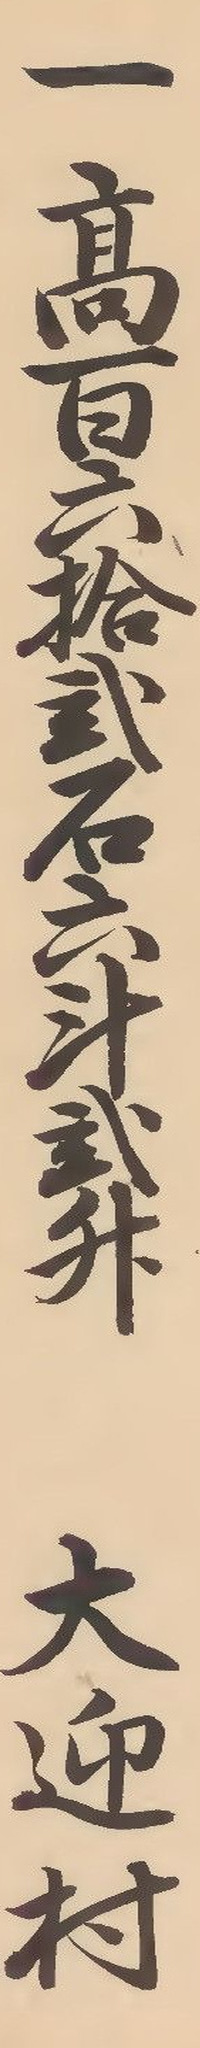一高百六拾弐石六斗弐升大迎村

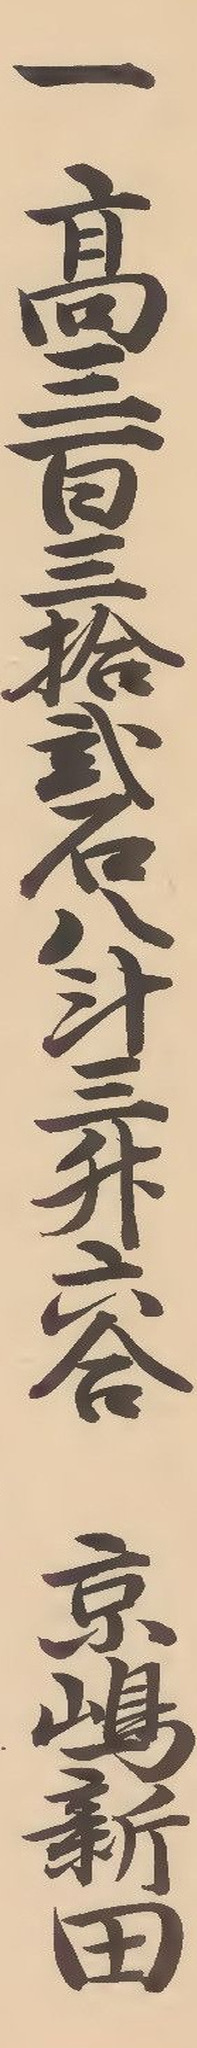一高三百三拾弐石八斗三升六合京島新田
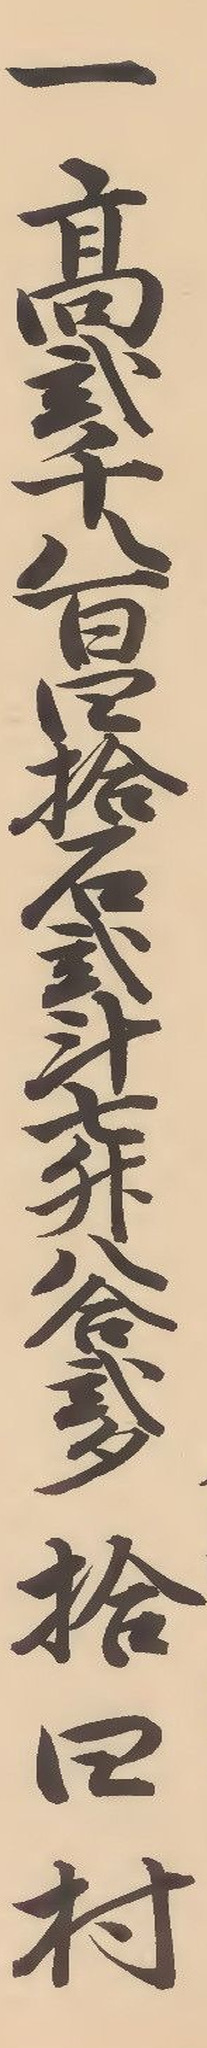一高弐千八百四拾石弐斗七升八合弐勺拾四村
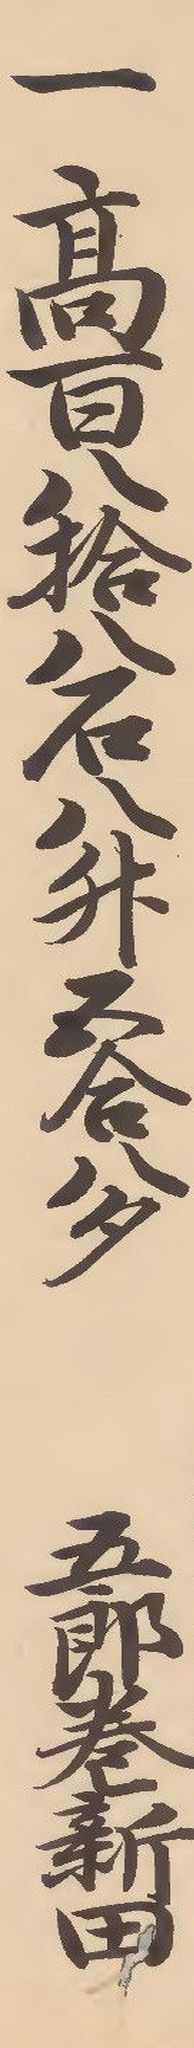一高百八拾八石八升五合八勺五郎巻新田
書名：越後国郷帳　下
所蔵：国立公文書館 National Archives of Japan
